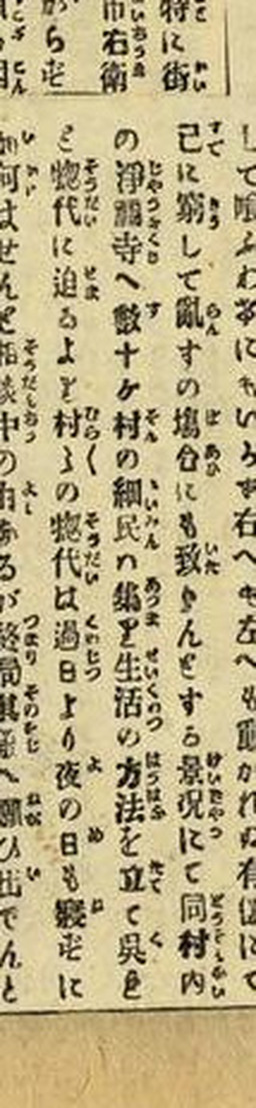の淨福寺へ數十ヶ村の細民は集り生活の方法を立て呉れ
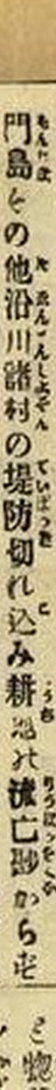門島その他沿川諸村の堤防切れ込み耕地の流亡尠からず
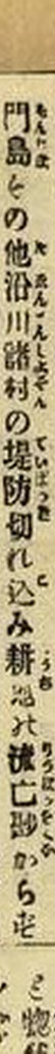門島その他沿川諸村の堤防切れ込み耕地の流亡尠からず
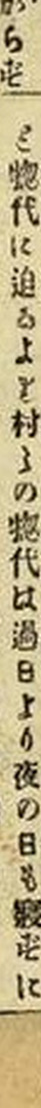と惣代に迫るより村々の惣代は過日より夜の目も寝ずに
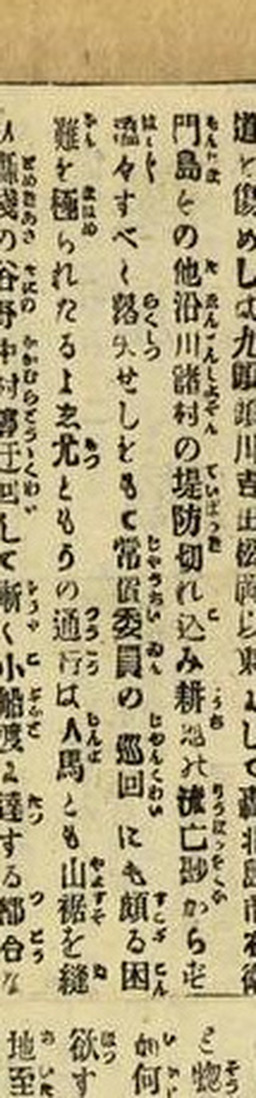橋々すべて落失せしをもて常置委員の巡回にも頗る困
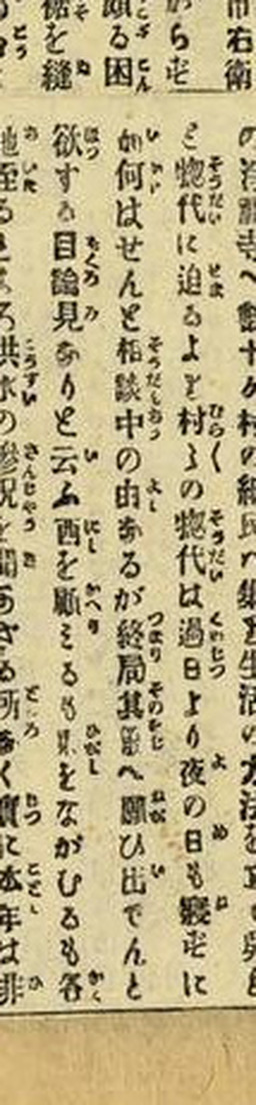如何はせんと相談中の由なるが終局其筋へ願ひ出でんと
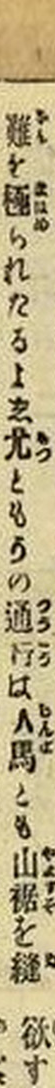難を極られたるよし尤ともかの通行は人馬とも山裾を縫
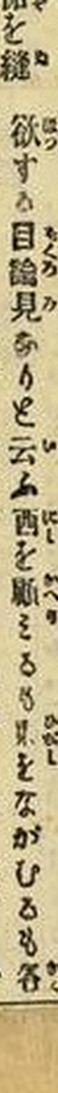欲する目論見なりと云ふ西を顧みるも東をながむるも各
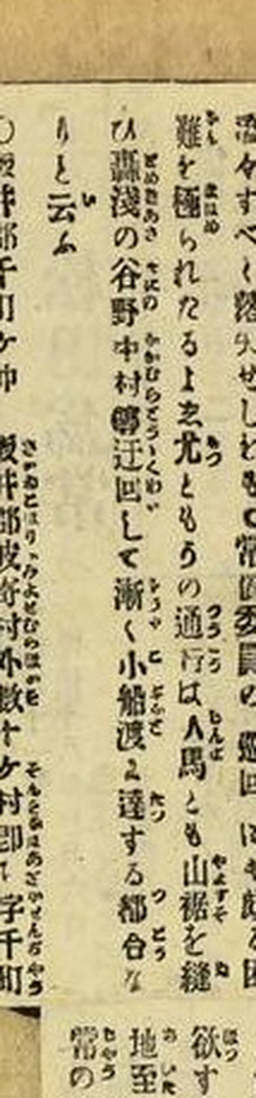ひ轟淺の谷野中村等迂回して漸く小船渡に達する都合な
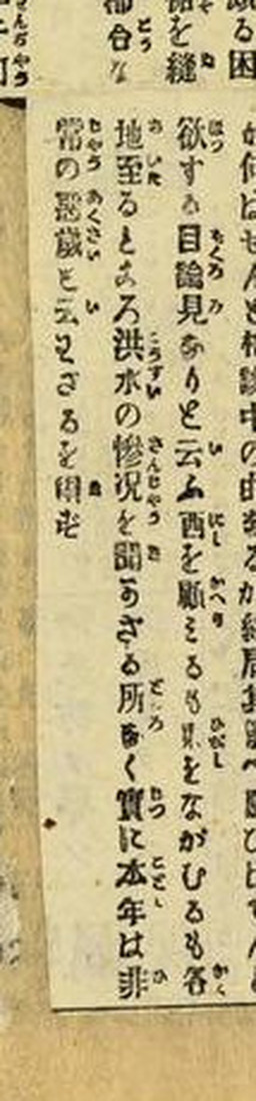地至るところ洪水惨况を聞かざる所なく實に本年は非
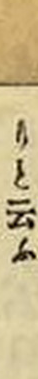りと云ふ
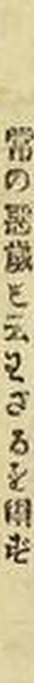常の惡歳と云わざるを得ず
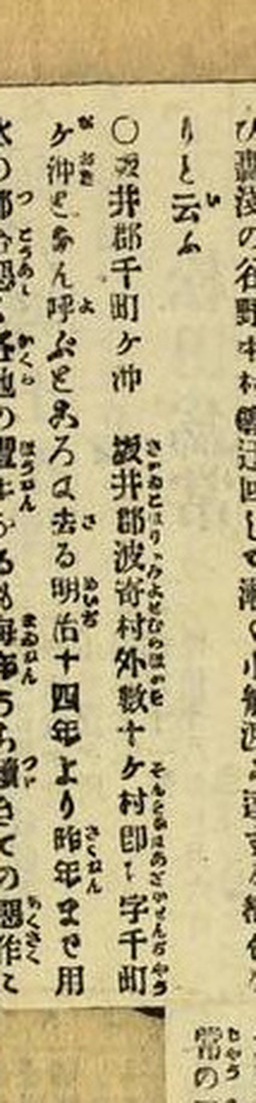○坂井郡千町ヶ沖坂井郡波寄村外數十ヶ村卽ち字千町
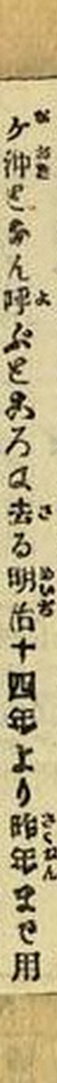ケ沖となん呼ぶところは去る明治十四年より昨年まで用
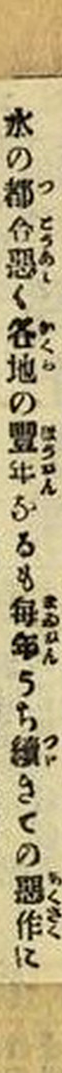水の都合惡く各地の豐年なるも毎年うち續きての惡作に
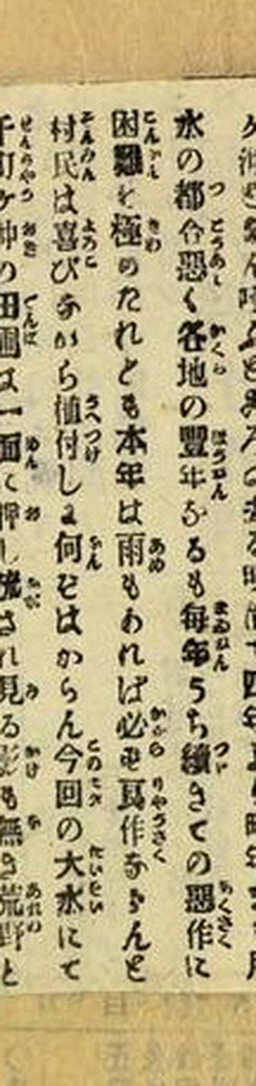困難を極めたれとも本年は雨もあれば必ず良作ならんと
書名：温古集 五巻
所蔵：福井県文書館 Fukui Prefectural Archives
